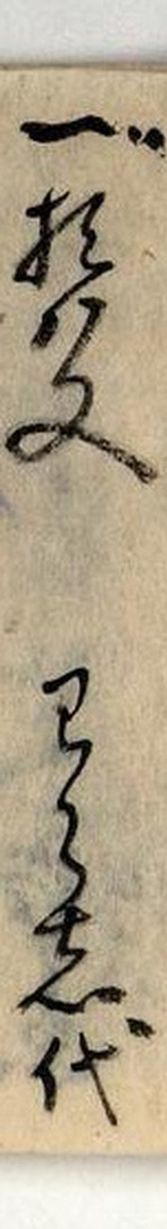一拾八文わらし代
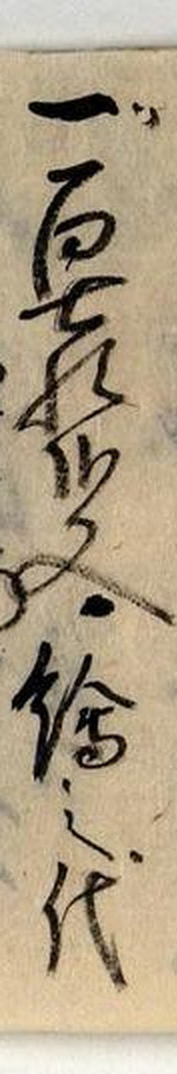一百七拾弐文絵之代
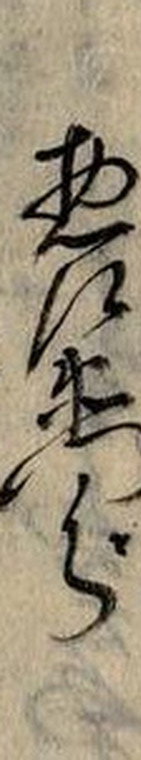惣左衛門分
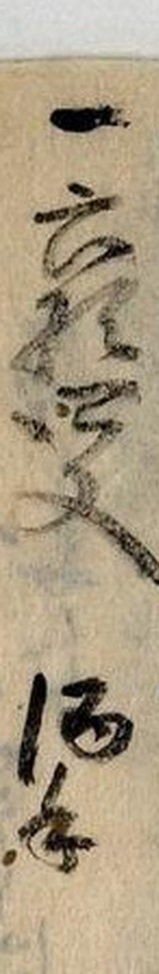一六拾四文酒手
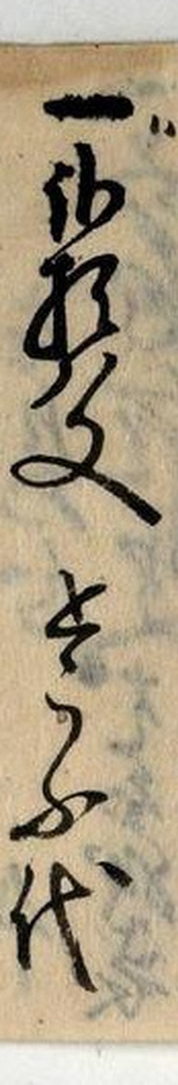一弐拾八文とうふ代
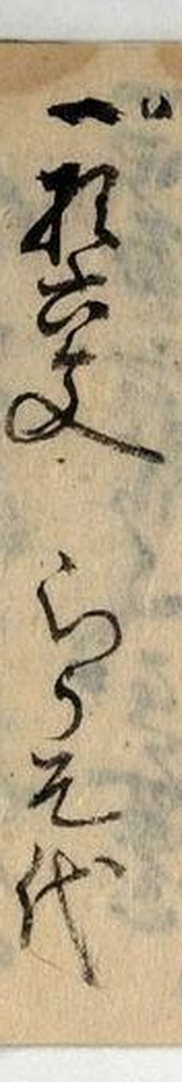一拾六文らうそ代
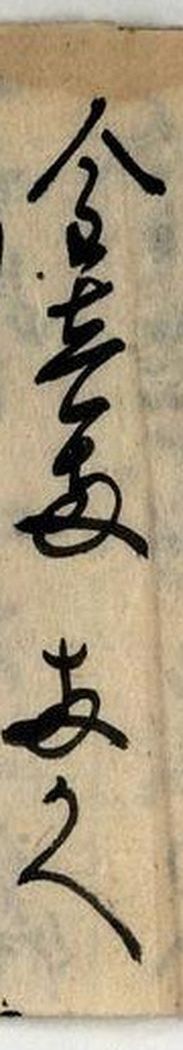金壱両両かへ
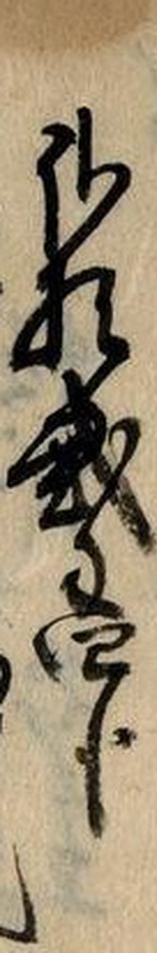弐拾弐匁四分
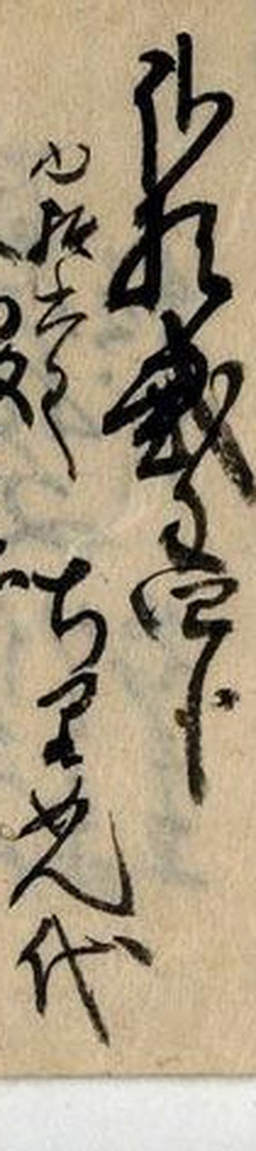拾六匁ちりめん代
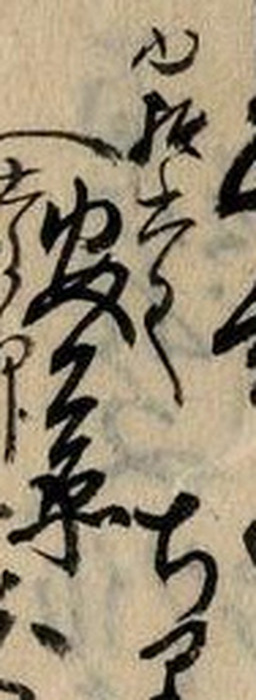安兵衛
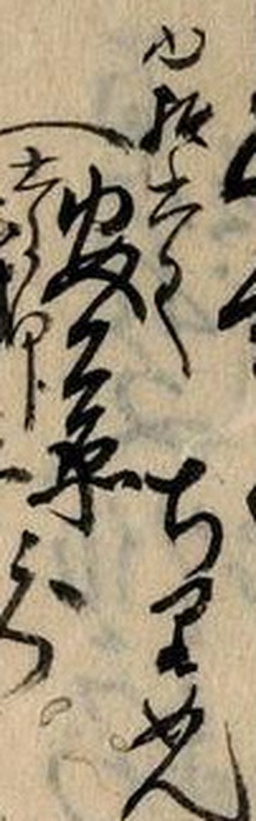安兵衛
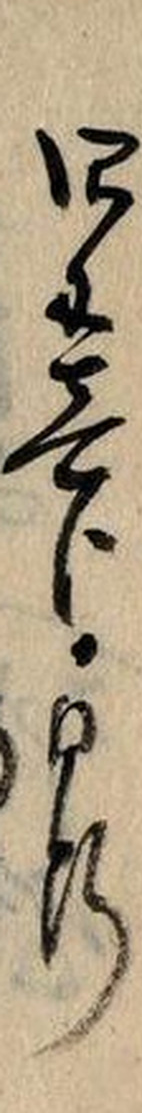四匁壱分同断

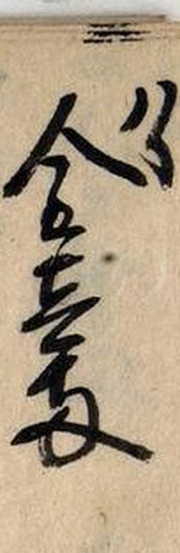金壱両
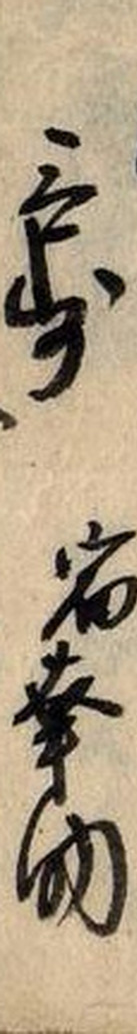三歩宿幸助
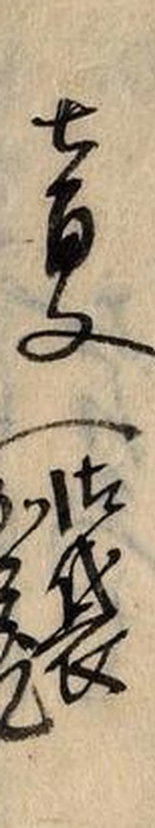七百文御袋
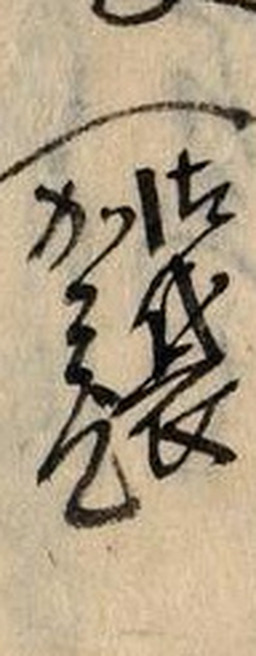かみ屋
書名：道中小遣留帳（旅）
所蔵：福井県文書館 Fukui Prefectural Archives
